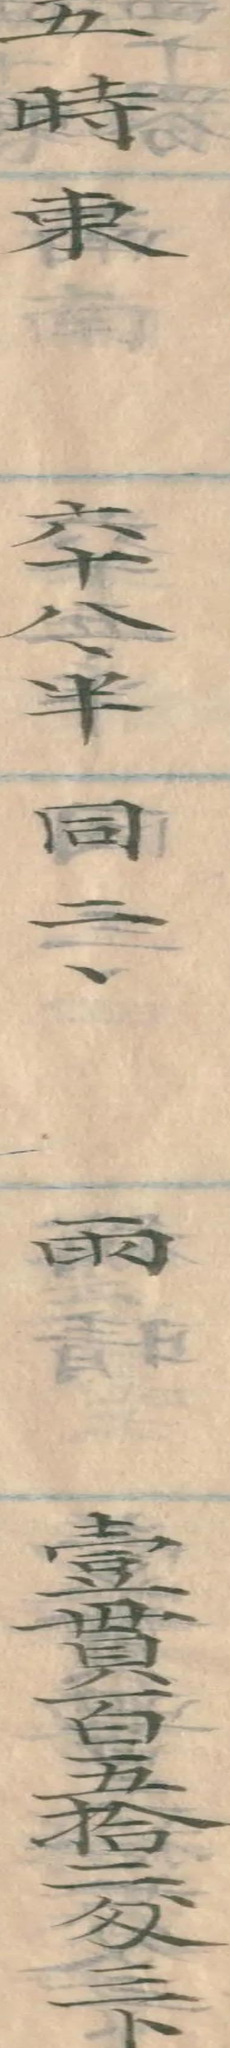五時東六十八ヽ半同二ヽ雨壱貫百五拾二匁三分
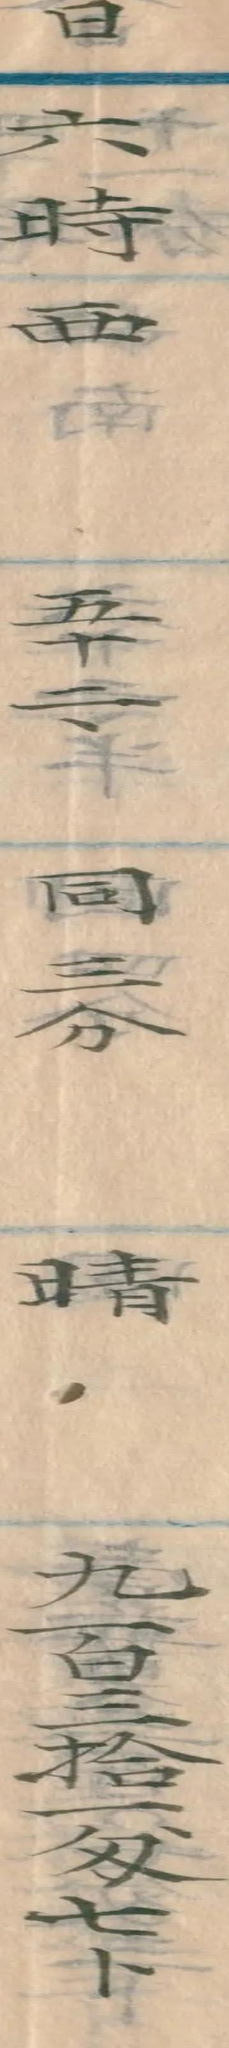廿日六時西五十二ヽ同三分晴九百三拾一匁七分
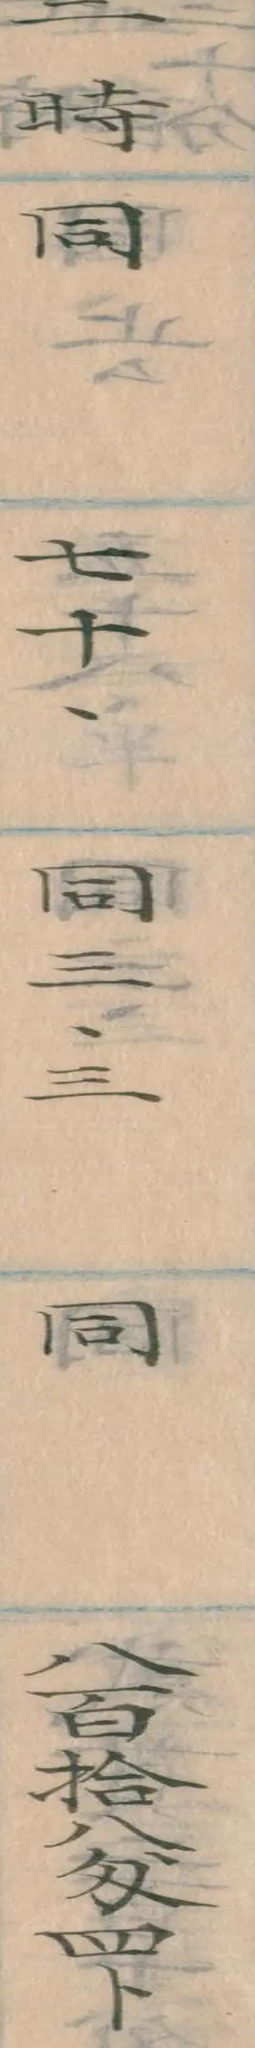三時同七十ヽ同三ヽ三同八百拾八匁四分
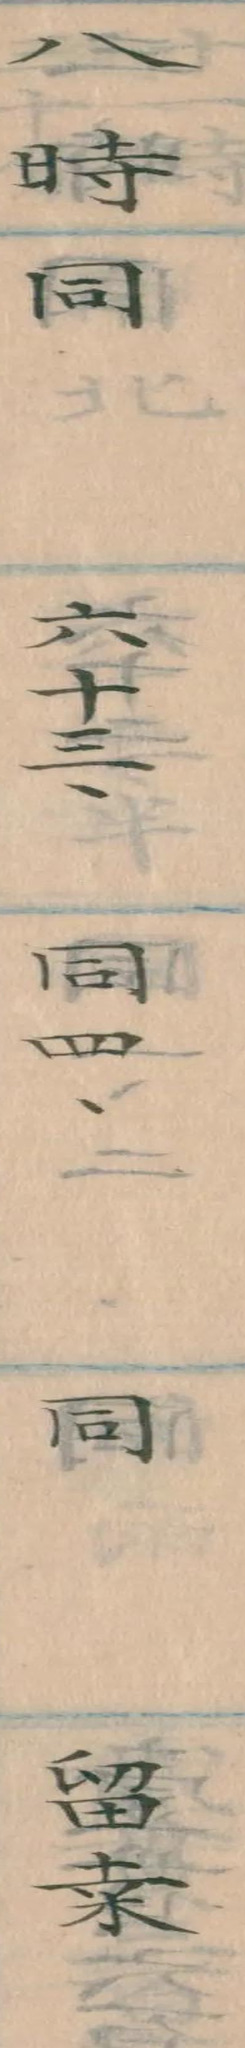八時同六十三ヽ同四ヽ同留桑
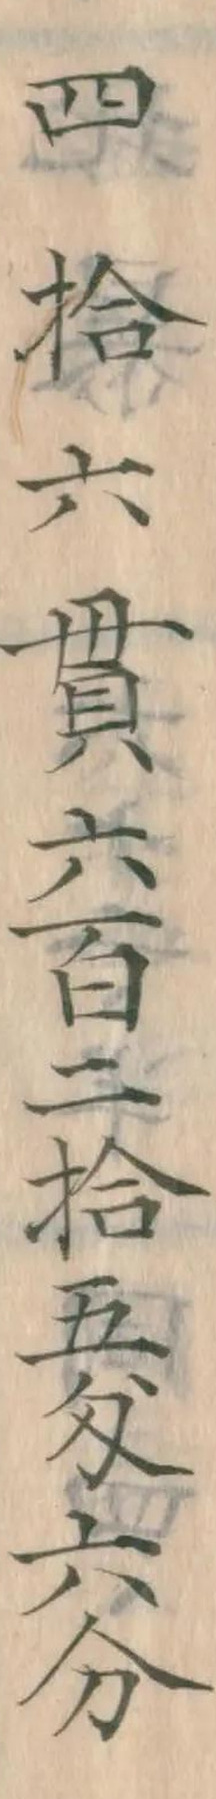四拾六貫六百二拾五匁六分
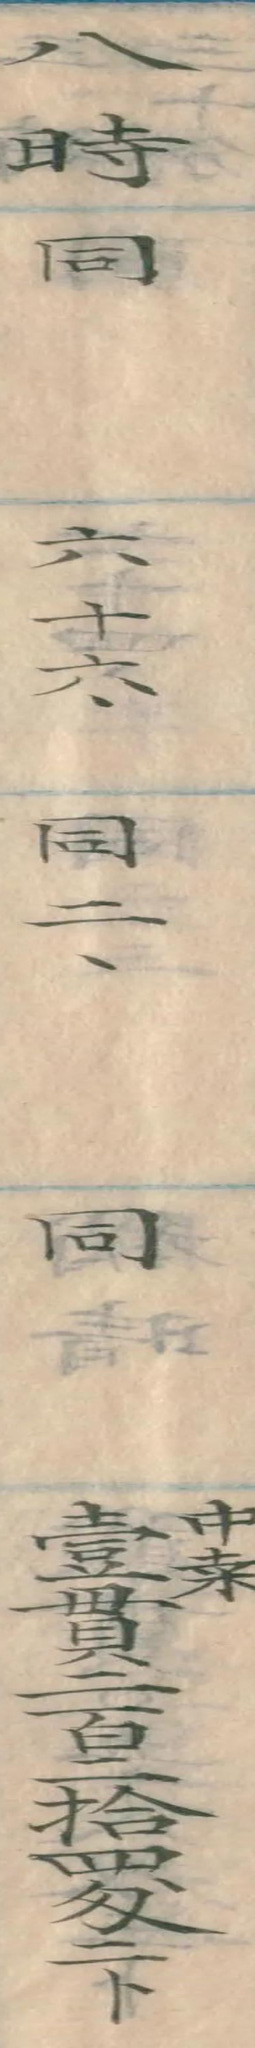八時同六十六ヽ同二ヽ同壱貫二百二拾四匁二分
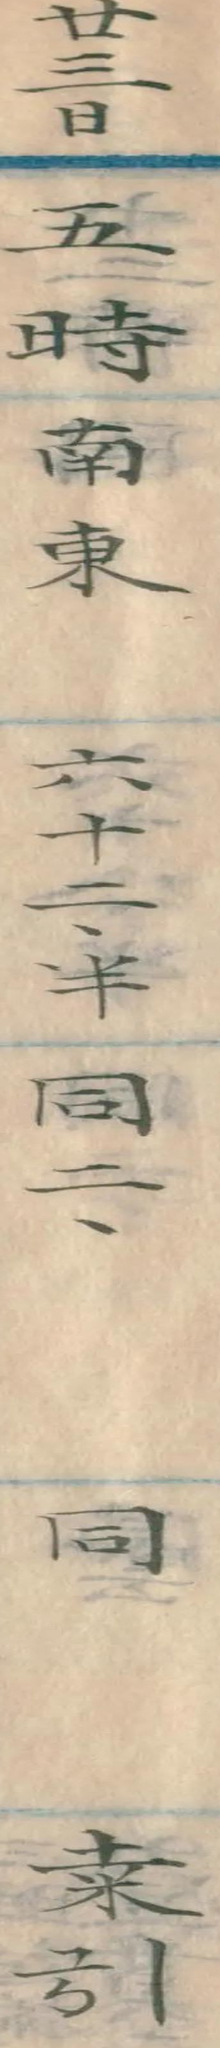廿三日五時南東六十二ヽ半同二ヽ同桑引
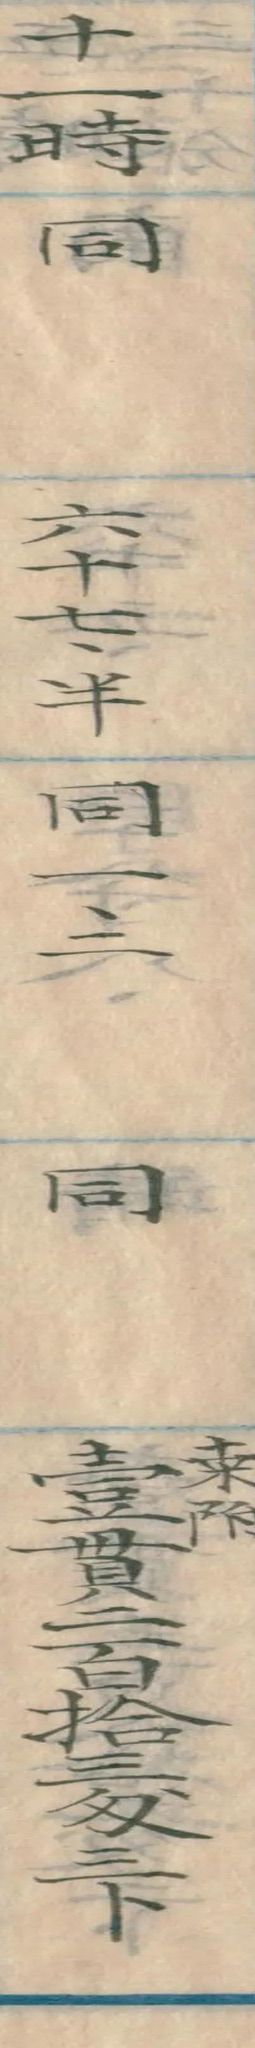十一時同六十七ヽ半同一ヽ二同壱貫二百拾三匁三分
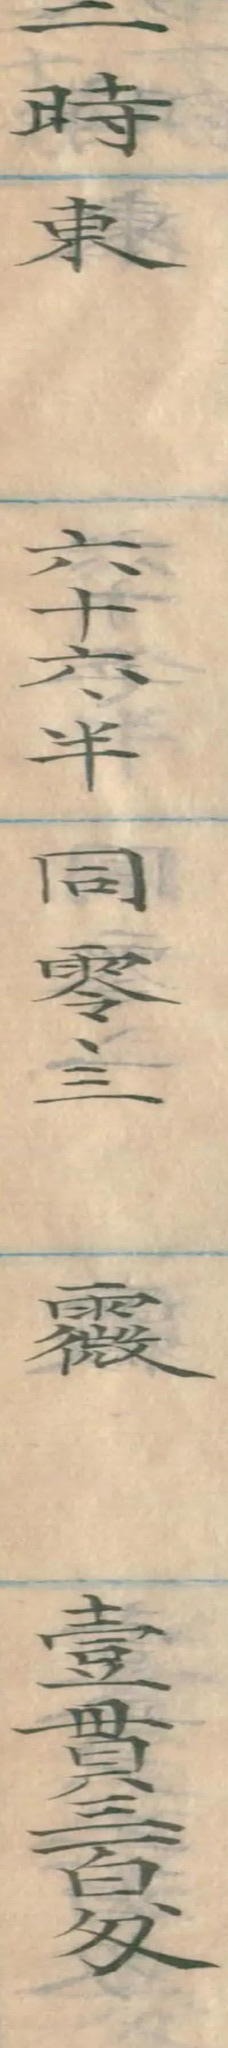三時東六十六ヽ半同零ヽ三霺壱貫三百匁

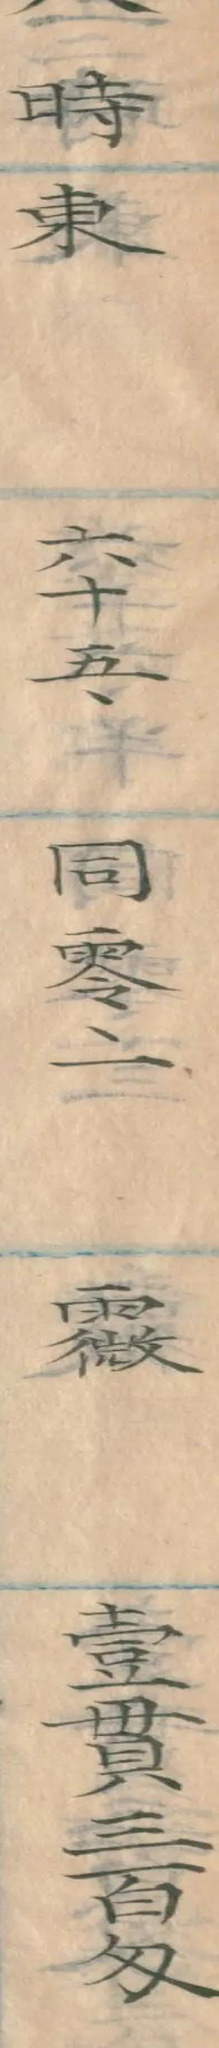八時東六十五ヽ同零ヽ一霺壱貫三百匁
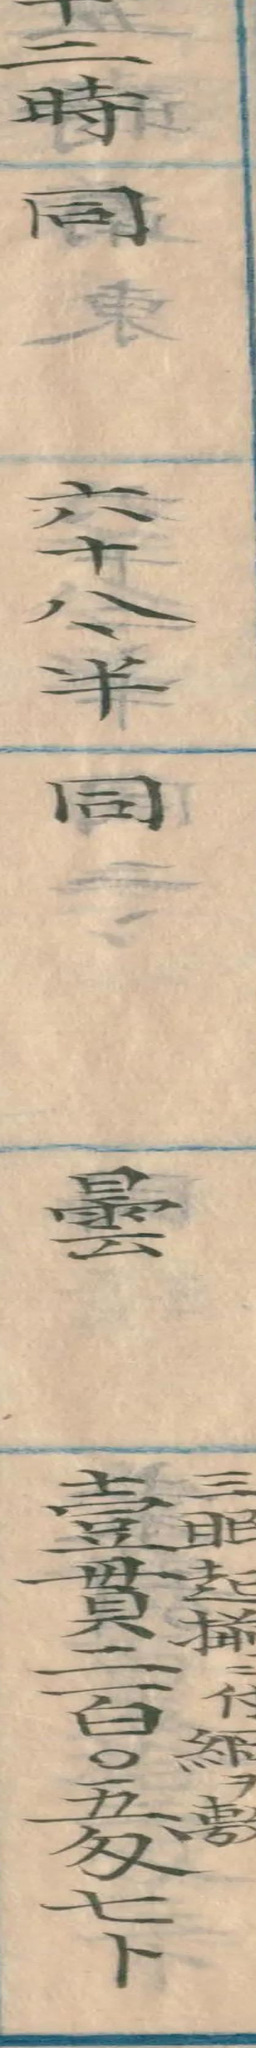十二時同六十八ヽ半同曇壱貫二百〇五匁七分
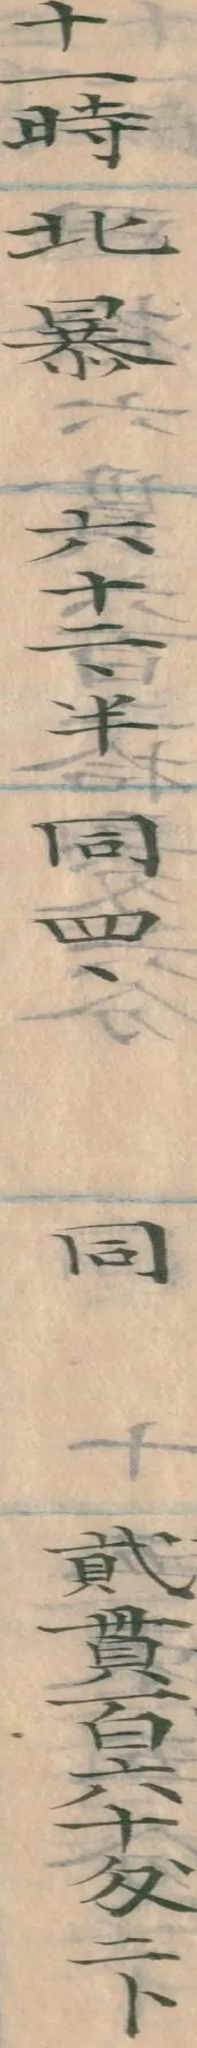十一時北暴六十二ヽ半同四ヽ同弐貫百六十匁二分
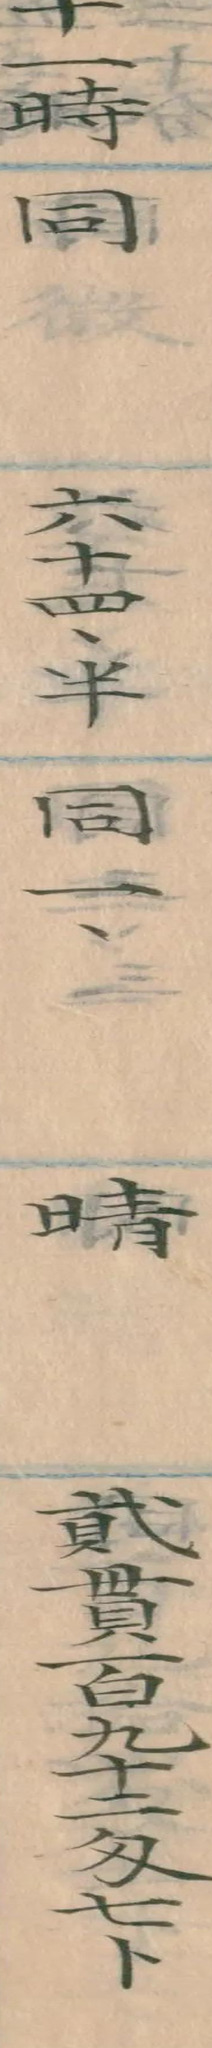十一時同六十四ヽ半同一ヽ晴弐貫百九十二匁七分
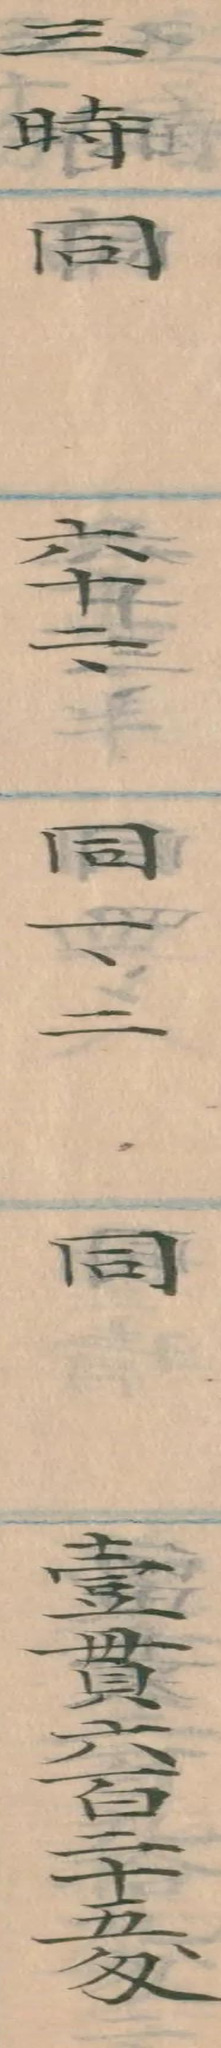三時同六十二ヽ同一ヽ二同壱貫六百二十五匁
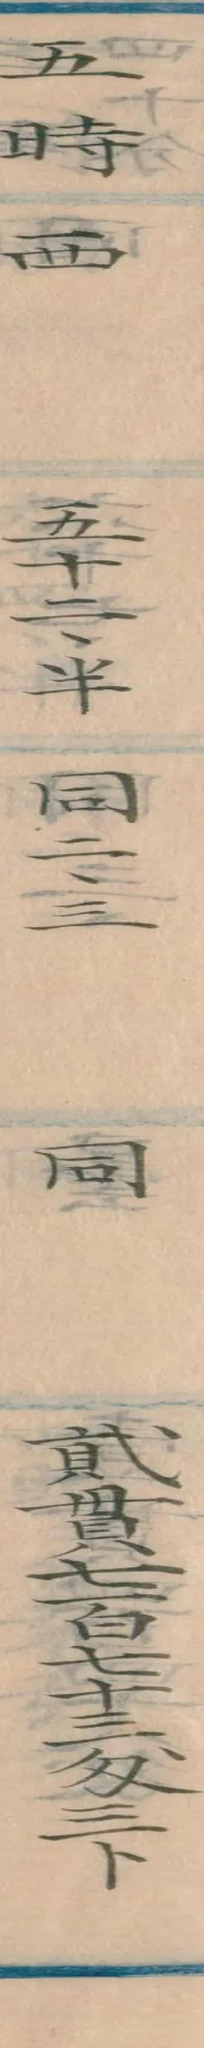廿六日五時西五十二ヽ半同二ヽ三同弐貫七百七十三匁三分
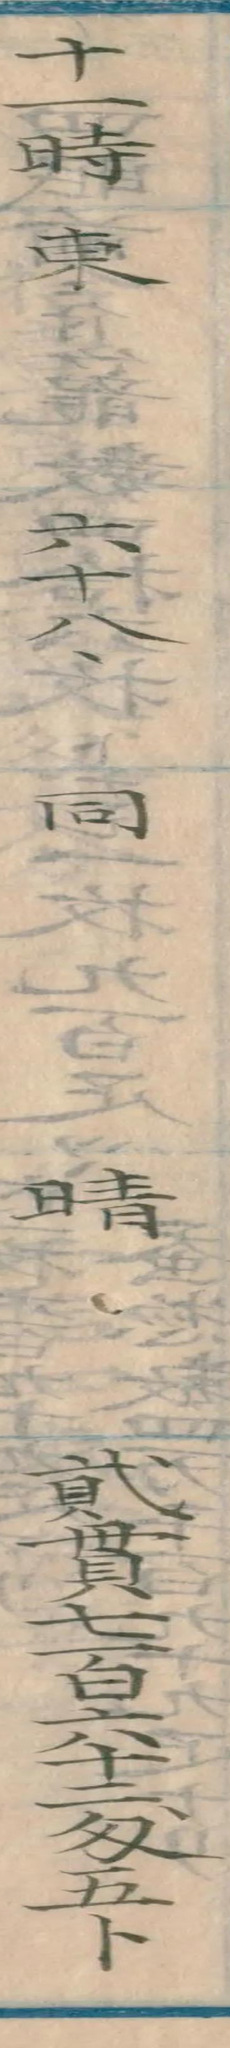十一時東六十八ヽ同晴弐貫七百六十二匁五分
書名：蚕桑集成
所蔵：国立国会図書館 National Diet Library, JAPAN
